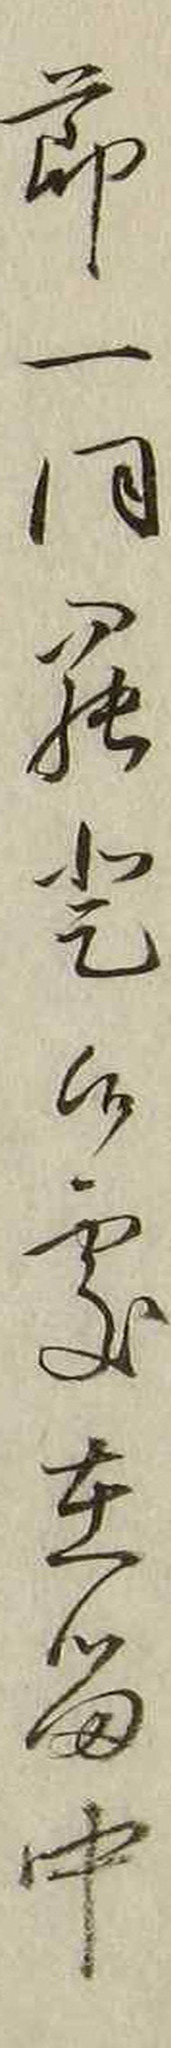節一同罷登候処在留中
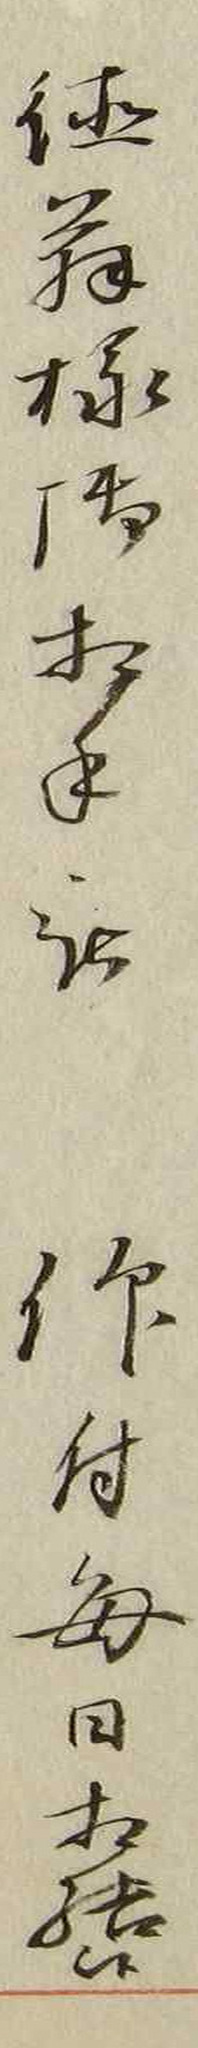徳翁様御相手被仰付毎日相結候
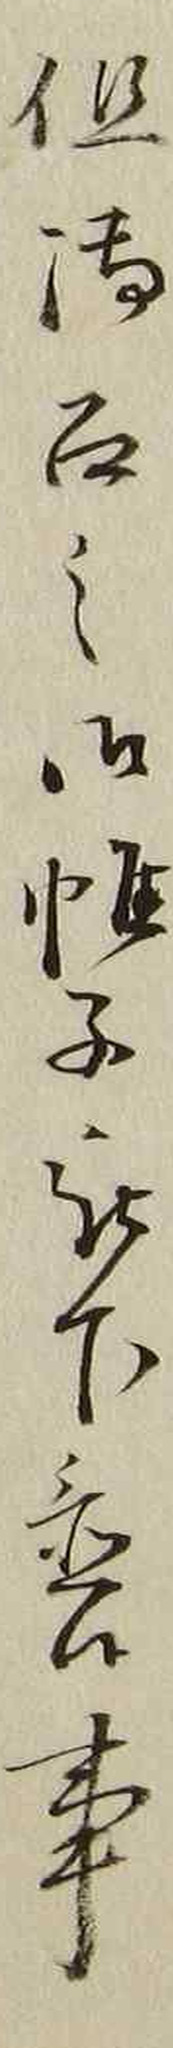但御召之御帷子被下置候事
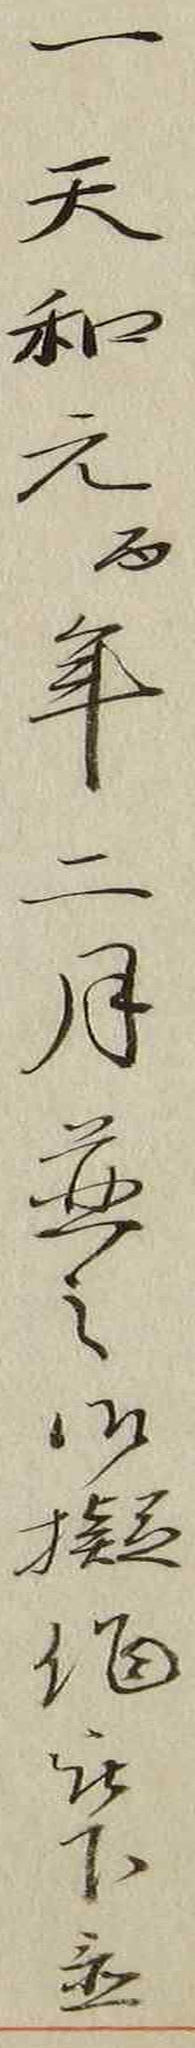一天和元酉年二月並之御擬作被下置
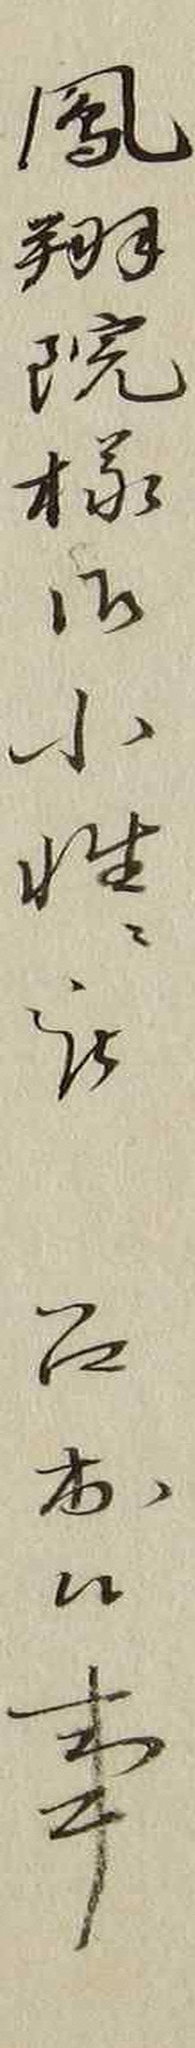鳳翔院様御小性ニ被召出候事
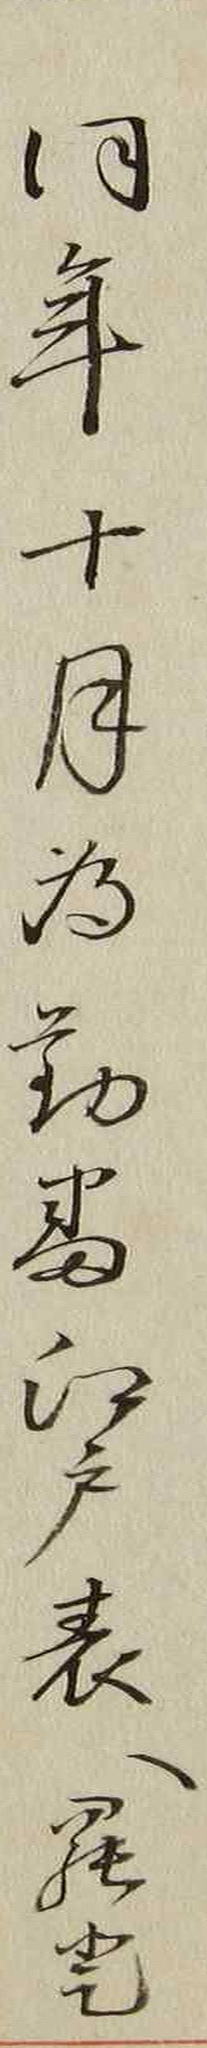一同年十月為勤番江戸表へ罷登
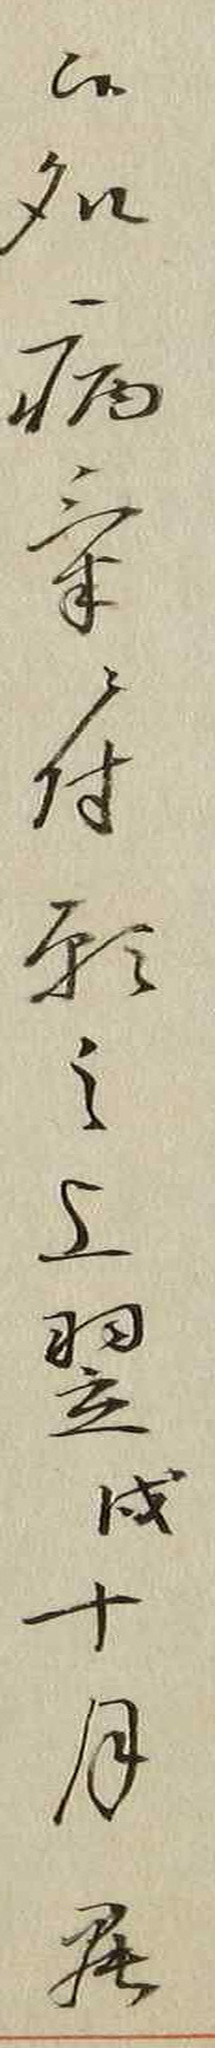候処病気ニ付願之上翌戌十月罷
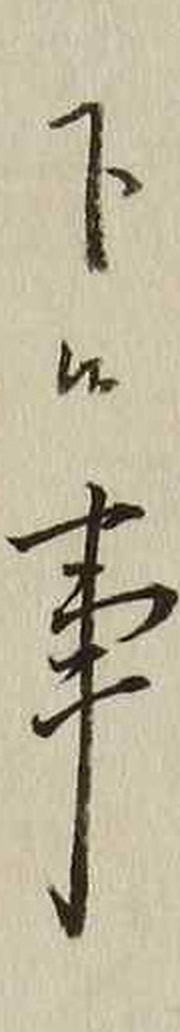下候事
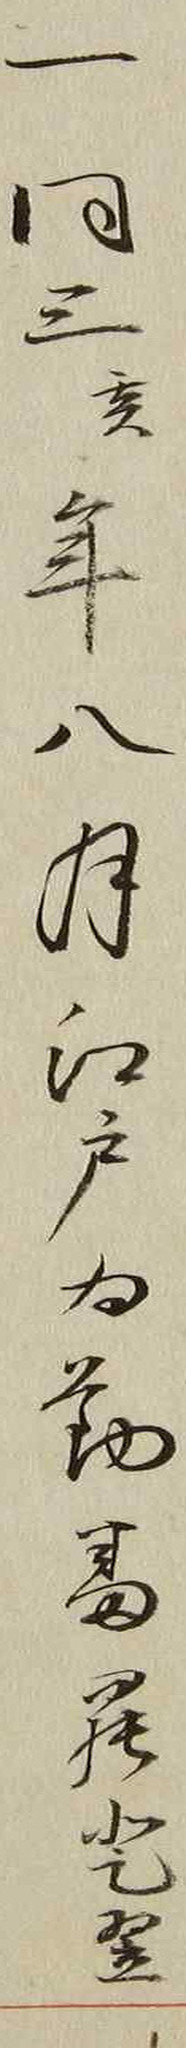一同三亥年八月江戸為勧番罷登翌
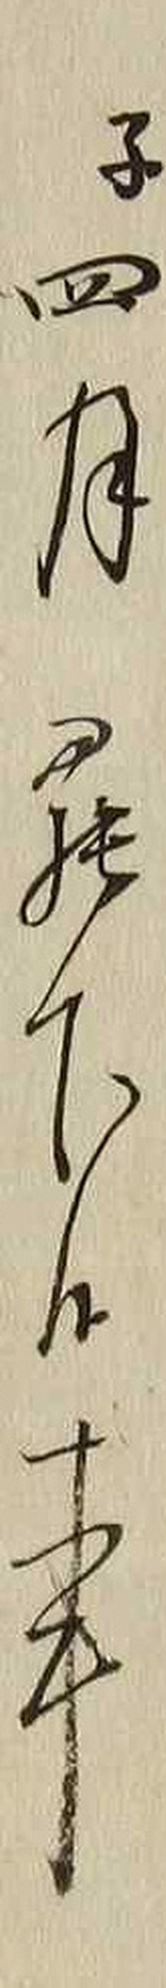子四月罷下候事
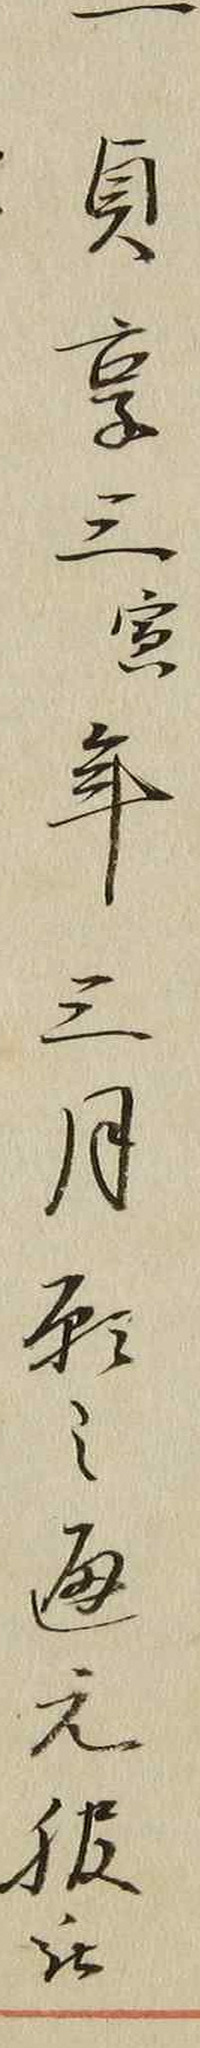一貞享三寅年三月願之通元服被
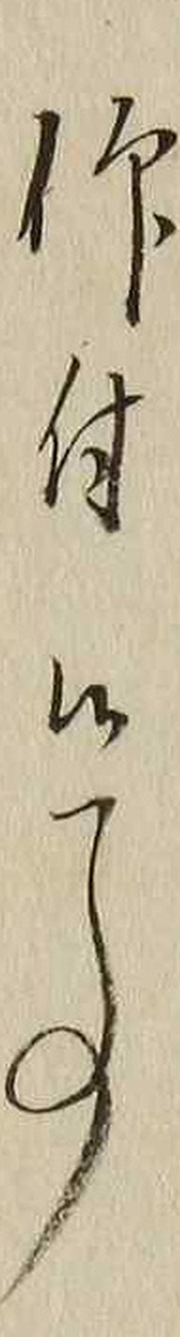仰付候事
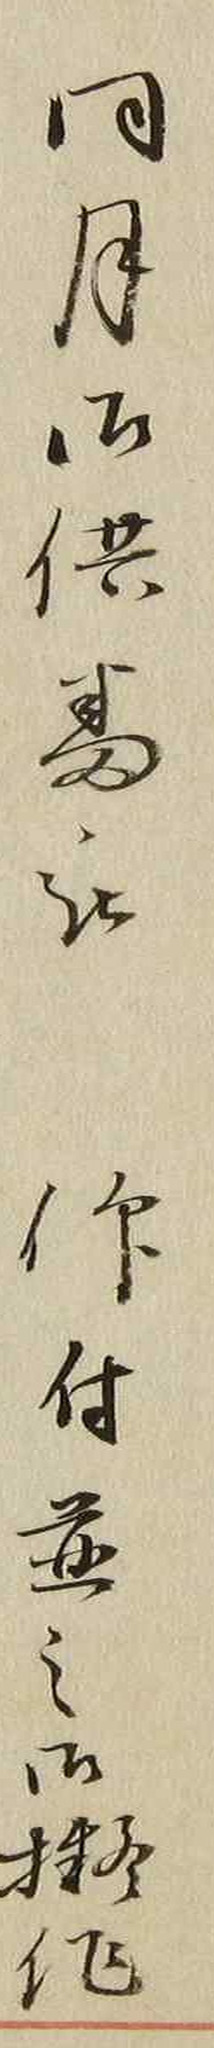一同月御供番被仰付並之御擬作
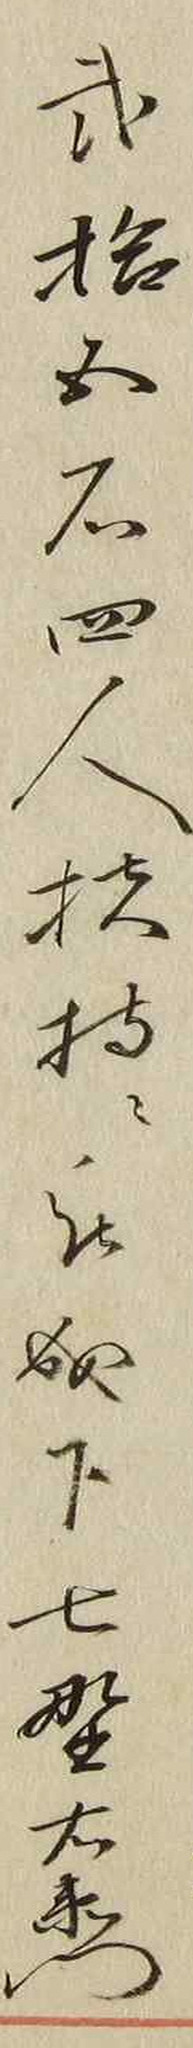弐拾五石四人扶持ニ被成下七野右衛門
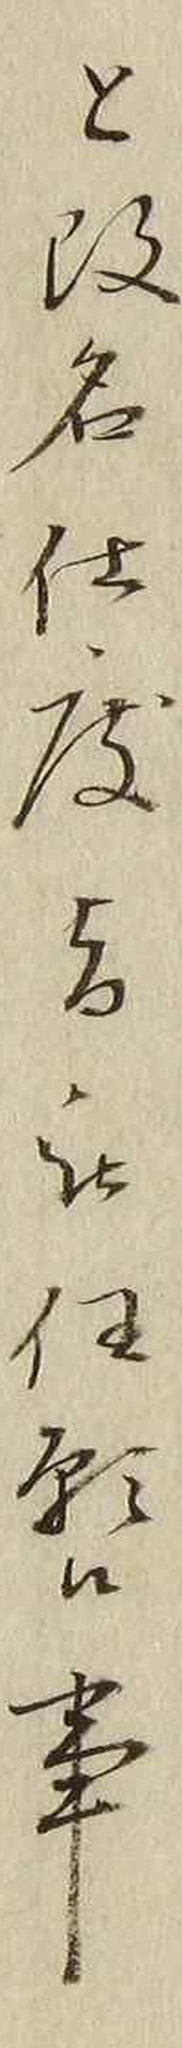と改名仕度旨被任願候事
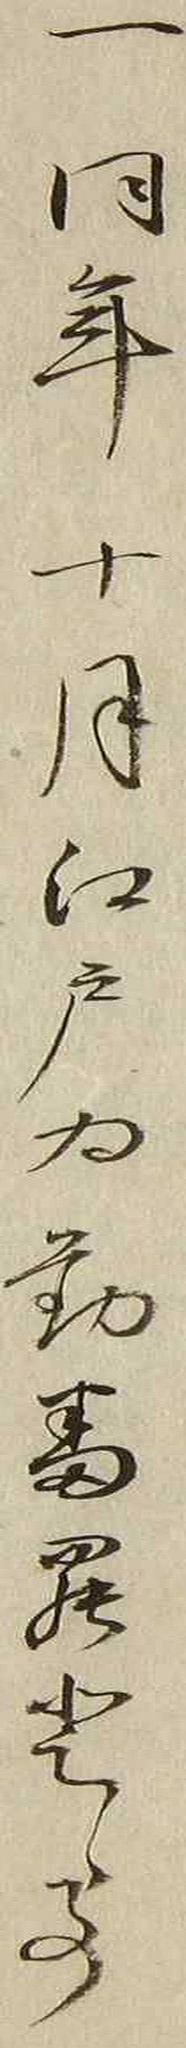一同年十月江戸為勤番罷登候事
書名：諸士系譜　巻之22　い之部22
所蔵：会津若松市立会津図書館
